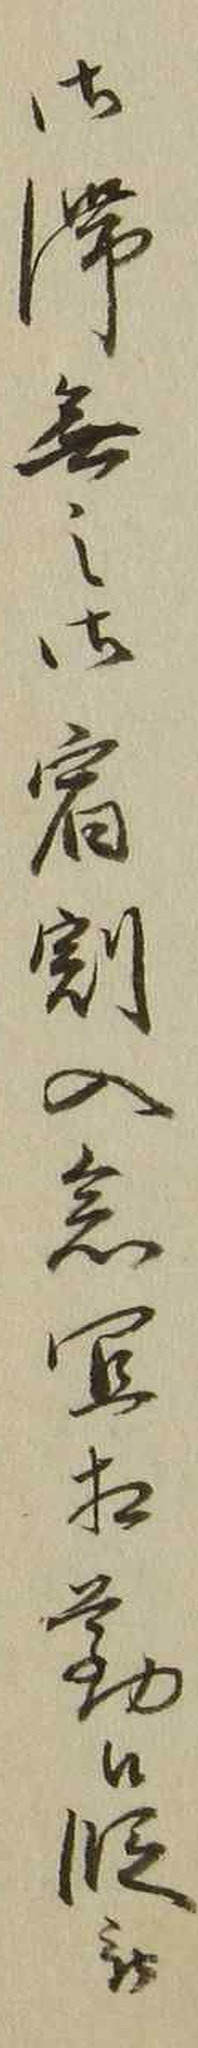御滞無之御宿割入念宜相勤候段被
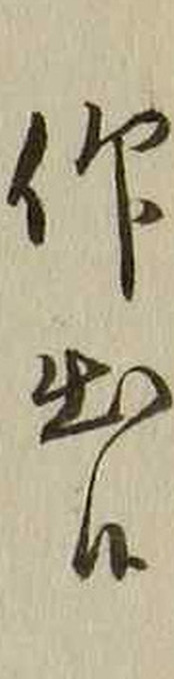仰出候
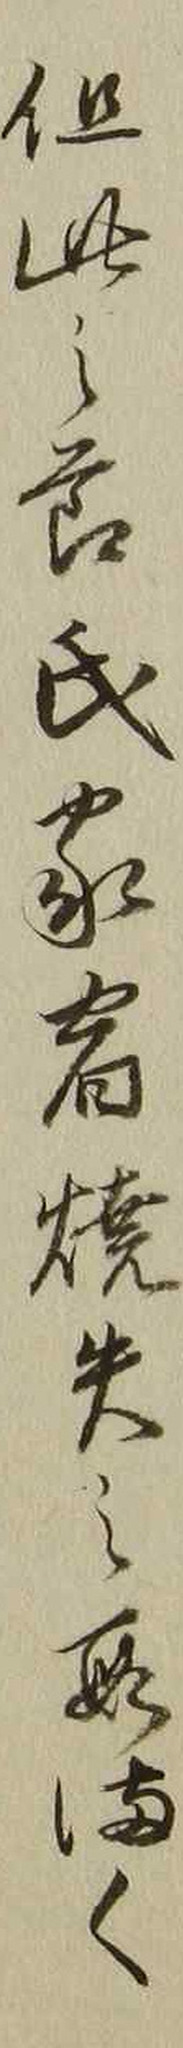但此之節氏家宿焼失之段まく
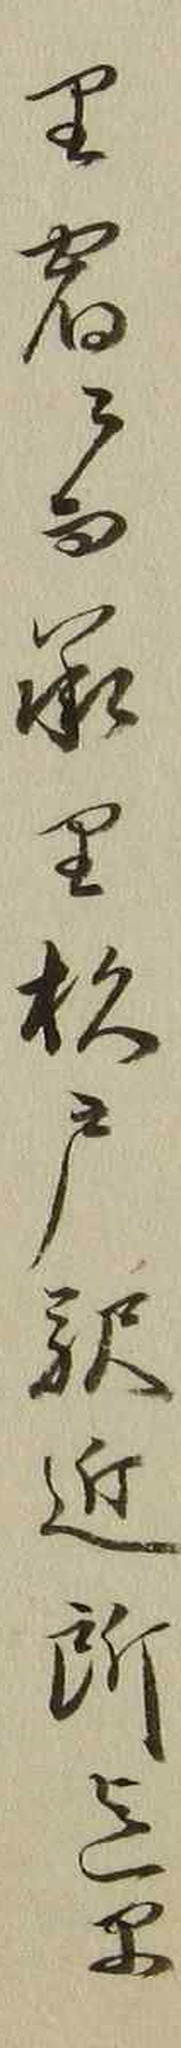り宿ニ而承り杉戸駅近所迄早
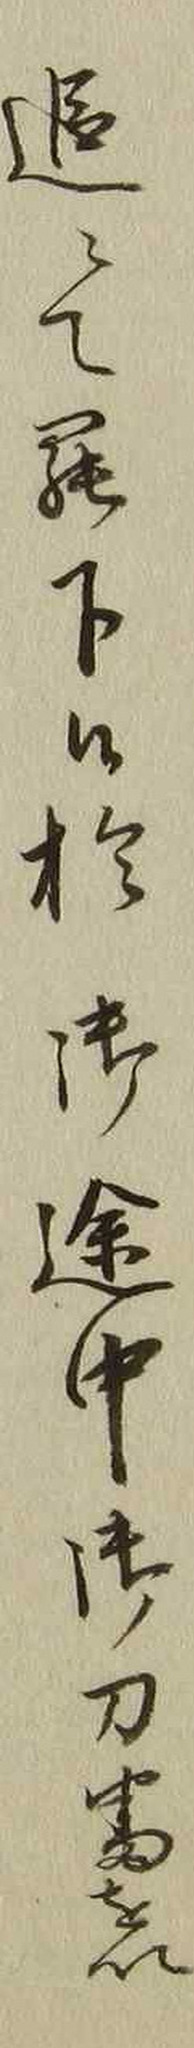追ニて罷下候於御途中御刀番を以
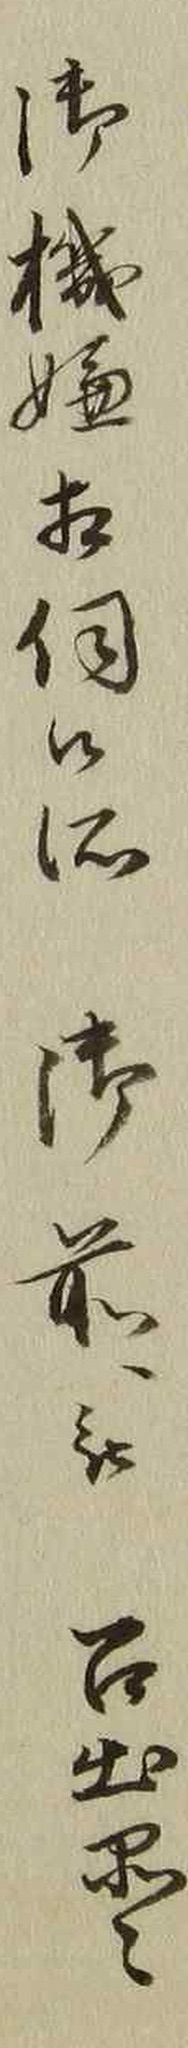御機嫌相伺候所御前へ被召出品々
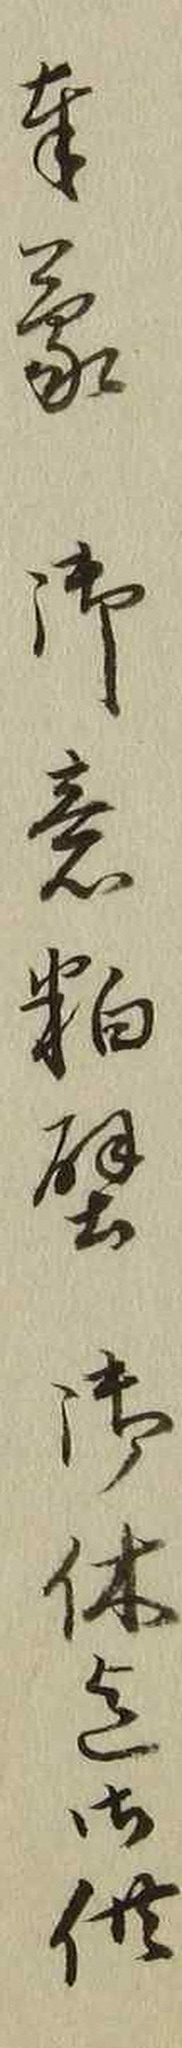奉蒙御意粕壁御休迄御供
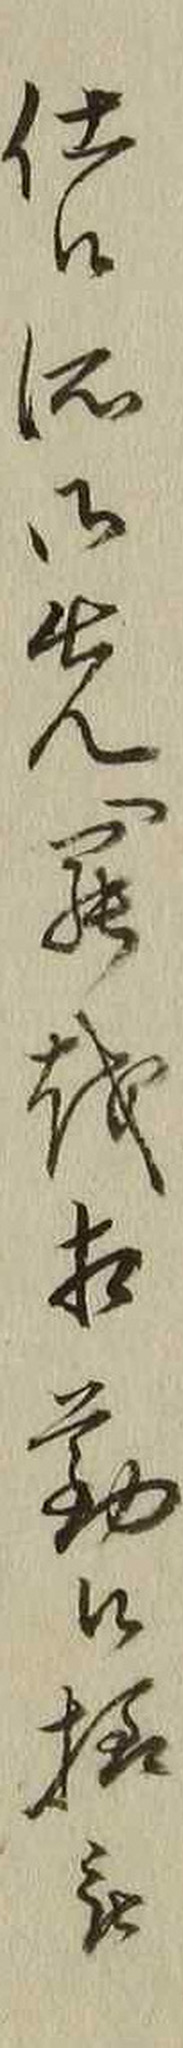仕候所御先へ罷越相勤候様被
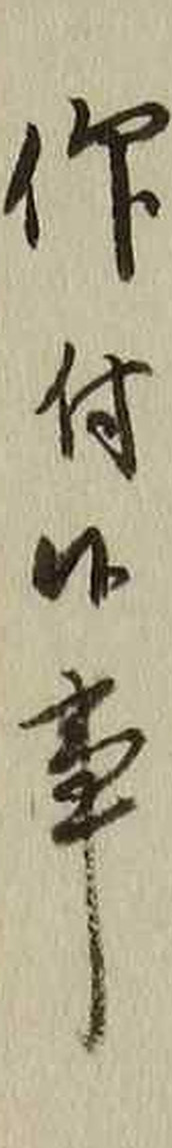仰付候事
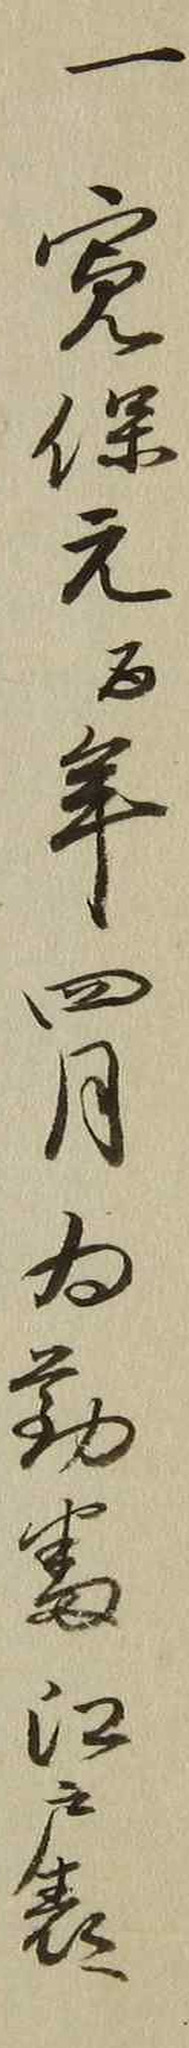一寛保元酉年四月為勤番江戸表へ
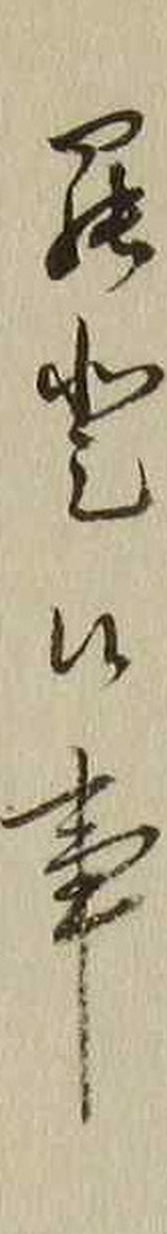罷登候事
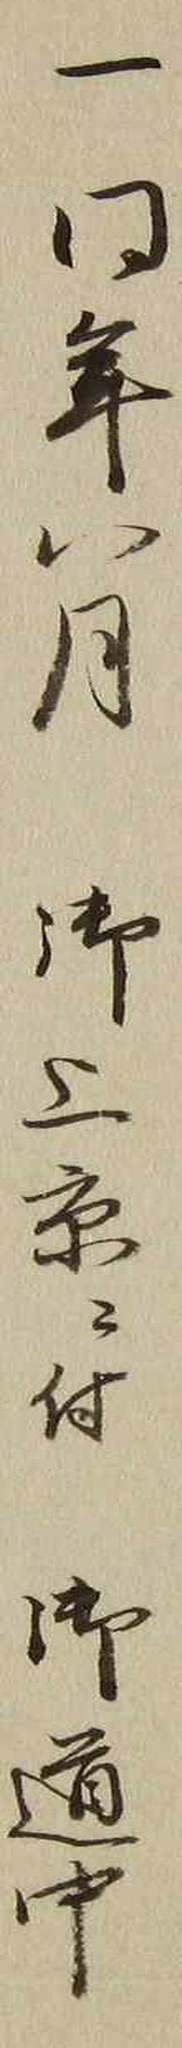一同年八月御上京ニ付御道中
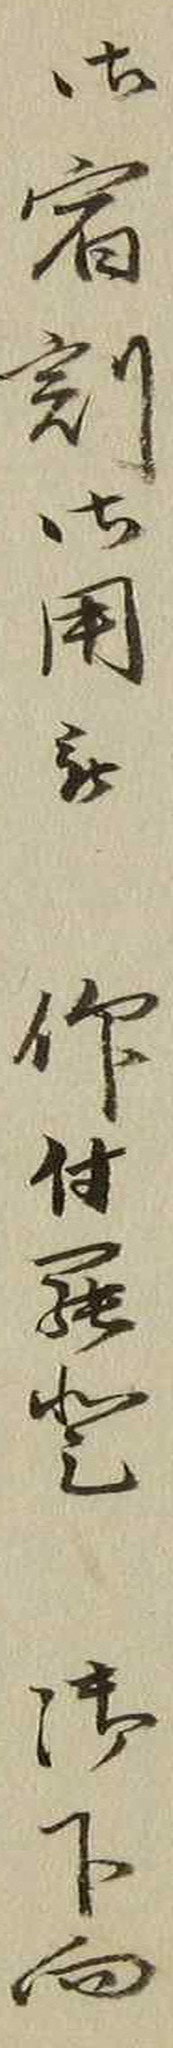御宿割御用被仰付罷登御下向
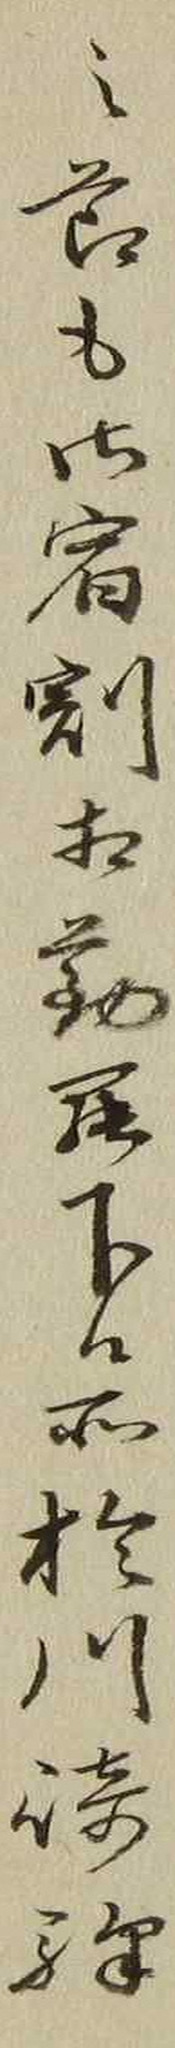之節も御宿割相勤罷下候所於川崎駅
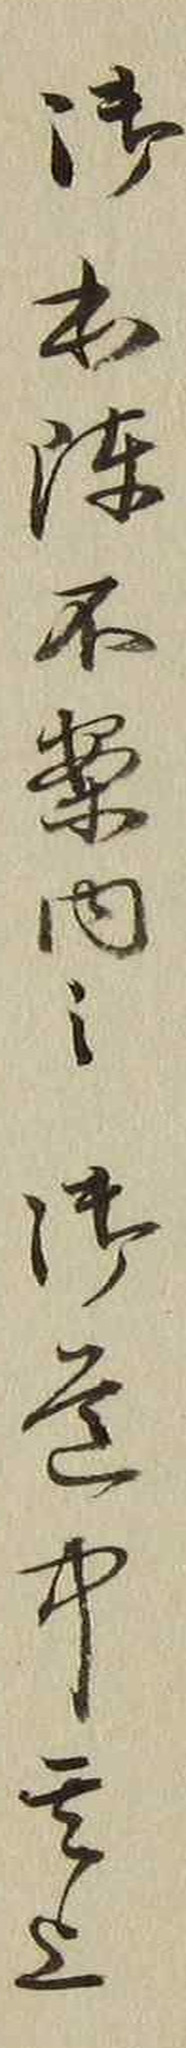御本陣不案内之御道中其上
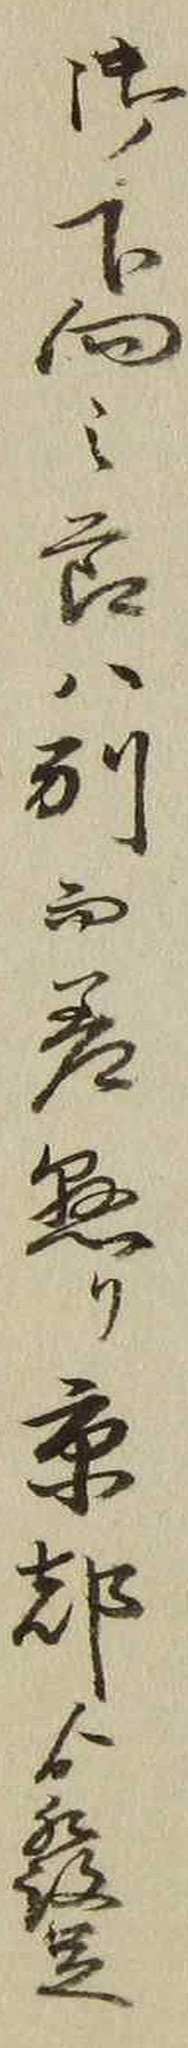御下向之節ハ別而差懸り京都ゟ発足
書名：諸士系譜　巻之128　た之部4
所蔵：会津若松市立会津図書館
